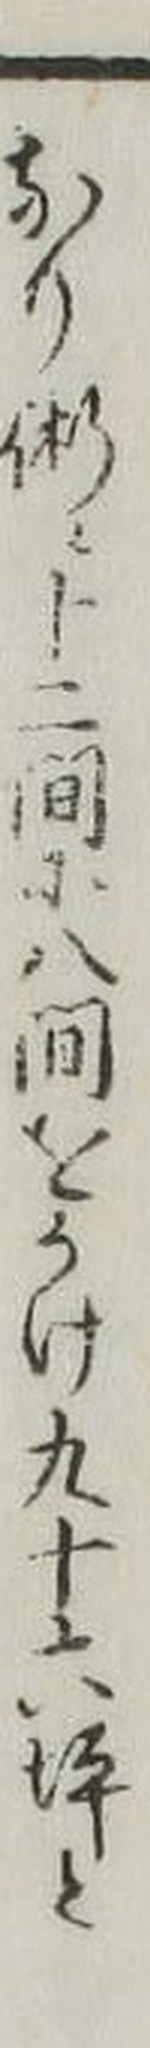なり術に十二間に八間をかけ九十六坪と
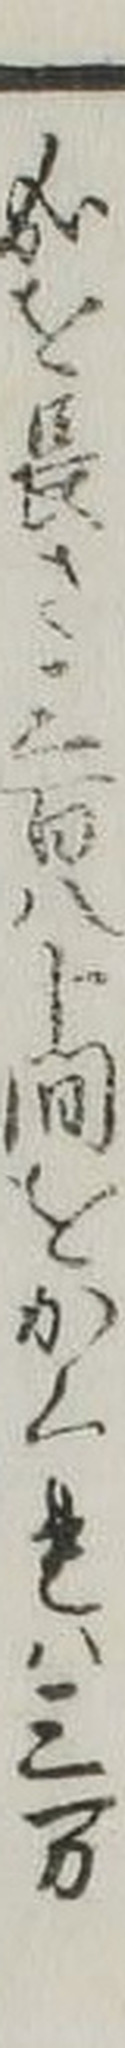成を長さ三百八十間をかくれは三万
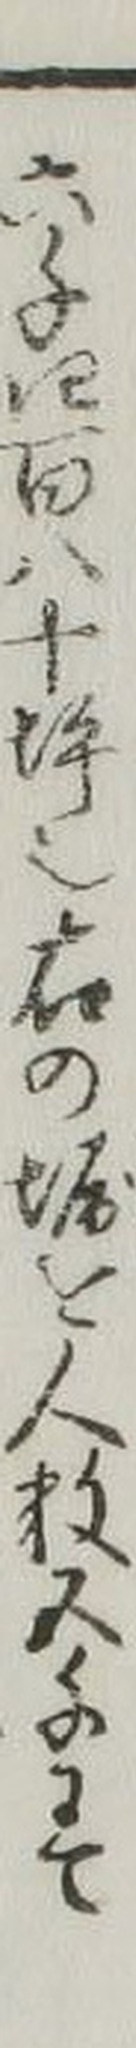六千四百八十坪也右の堀を人数五千にて
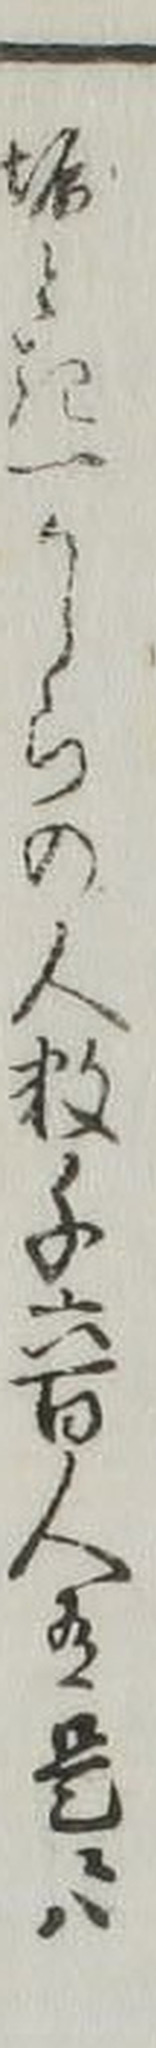堀とき一かしらの人数千六百人有是には
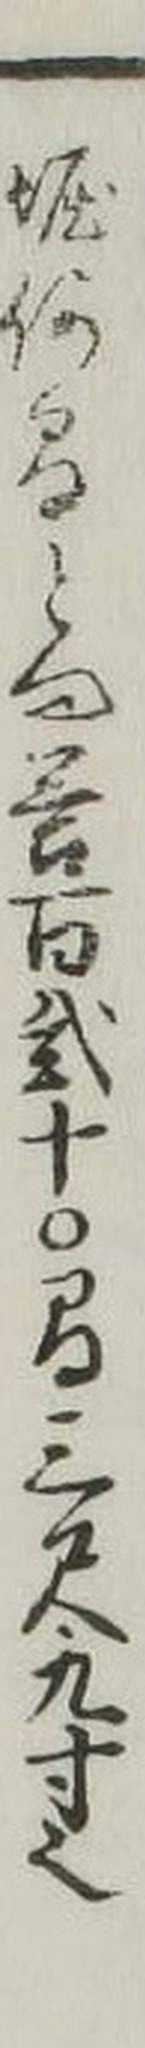堀何間と問答百弐十〇間三尺九寸也
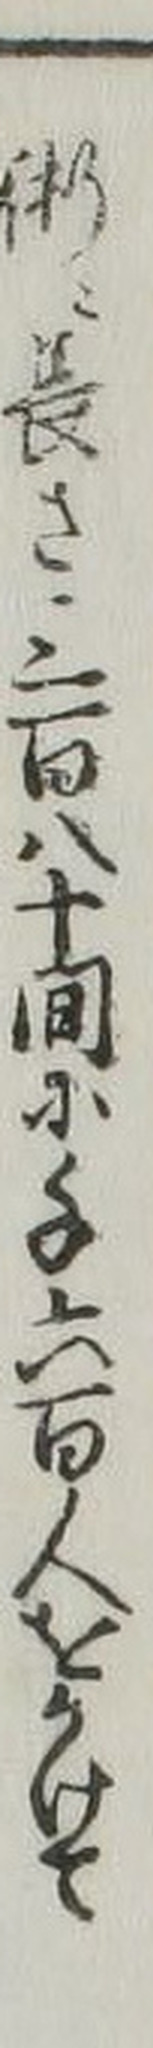術に長さ三百八十間に千六百人をかけて
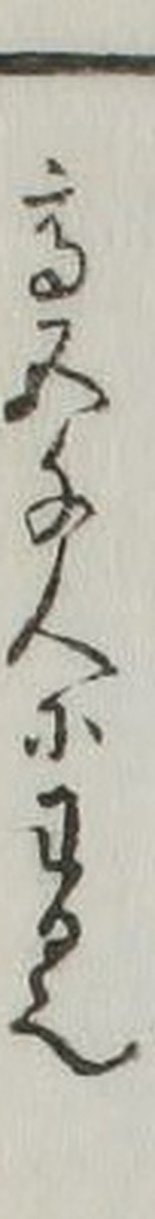高五千人にわる也
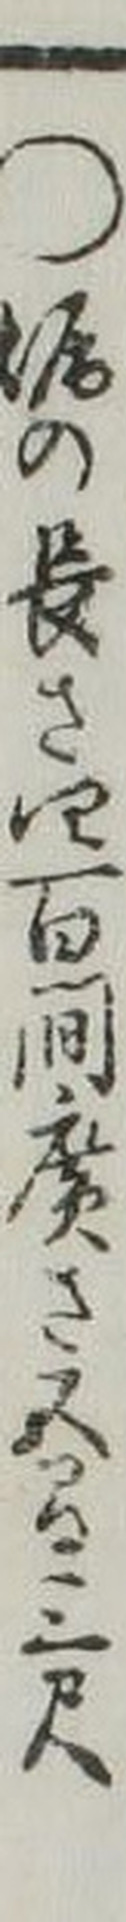○堀の長さ四百間広さ五間三尺
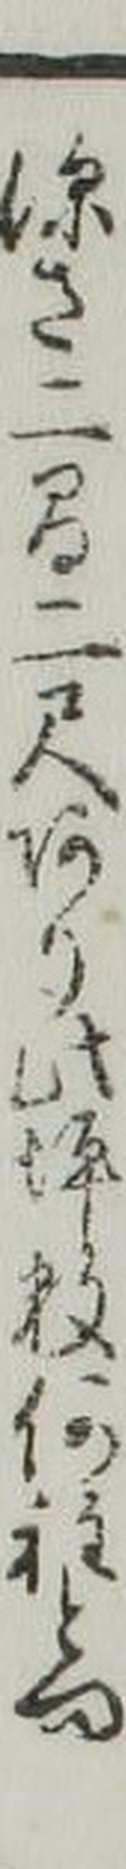深さ二間二尺あり此坪数何程と問
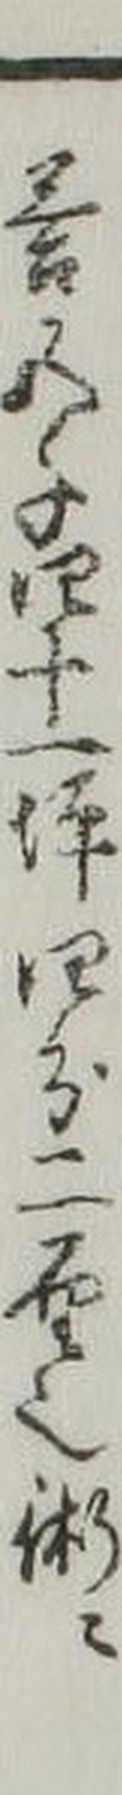答五千四十一坪四分二厘也術に
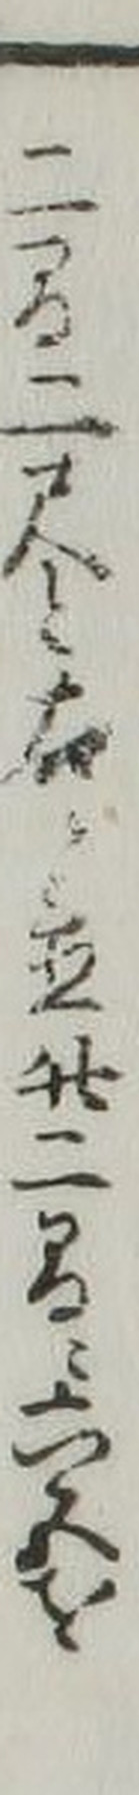二間二尺と右に置此二間に六五を
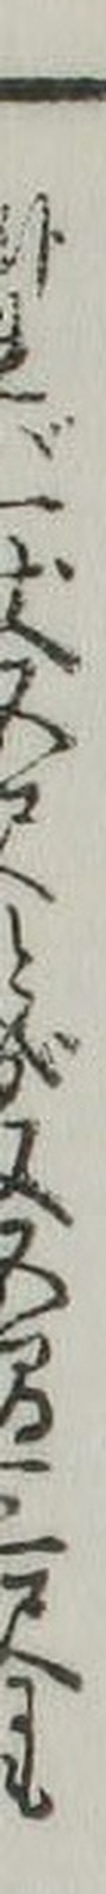掛れば一丈五尺と成又五間三尺にも
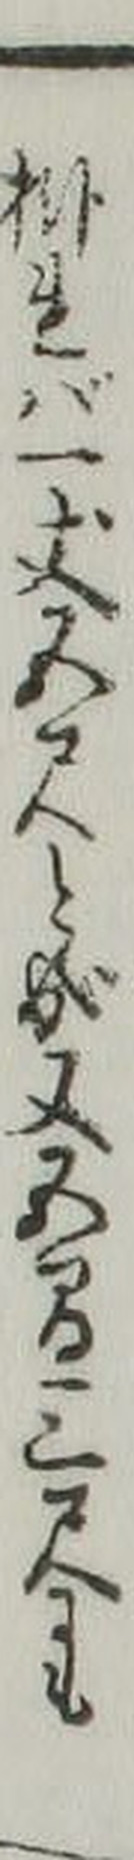掛れば一丈五尺と成又五間三尺にも
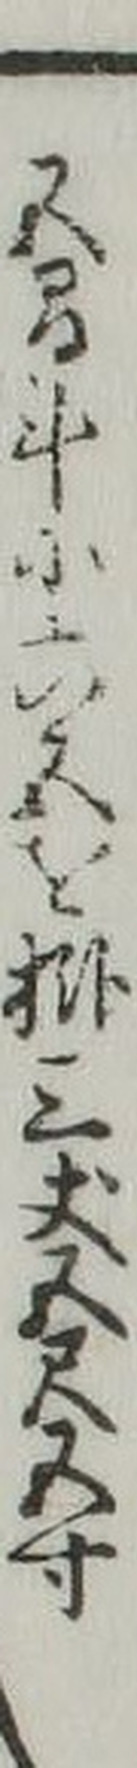五間計に六五を掛三丈五尺五寸
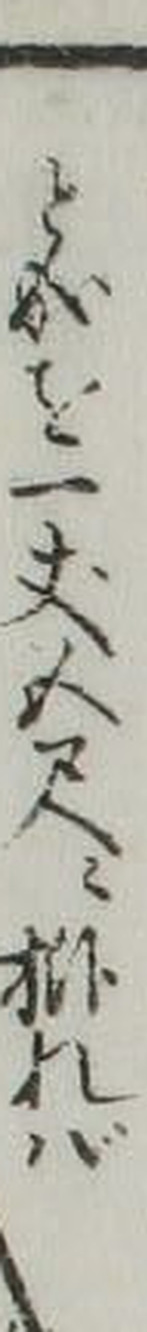と成を一丈五尺に掛れば
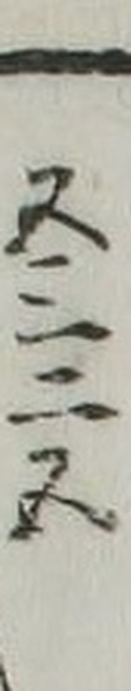五三二五
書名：宝玉塵劫記
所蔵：東京学芸大学教育コンテンツアーカイブ
